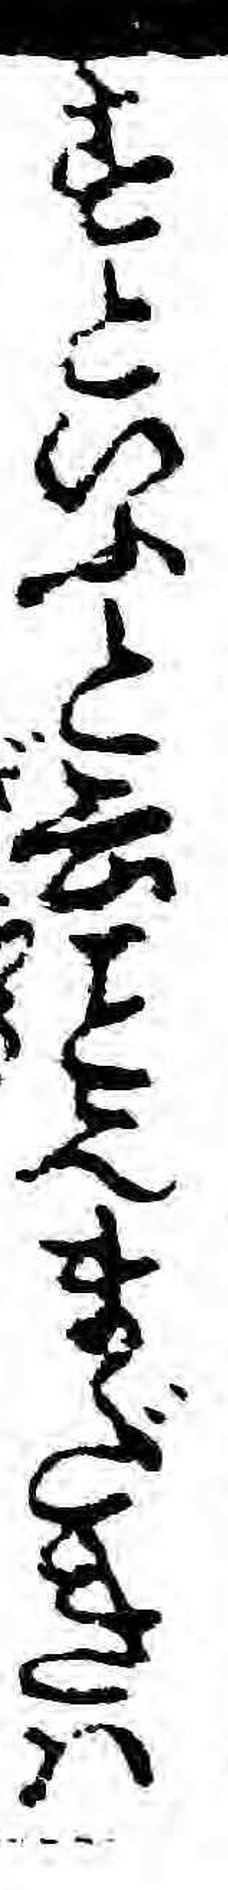すといふと云こと也まだきは
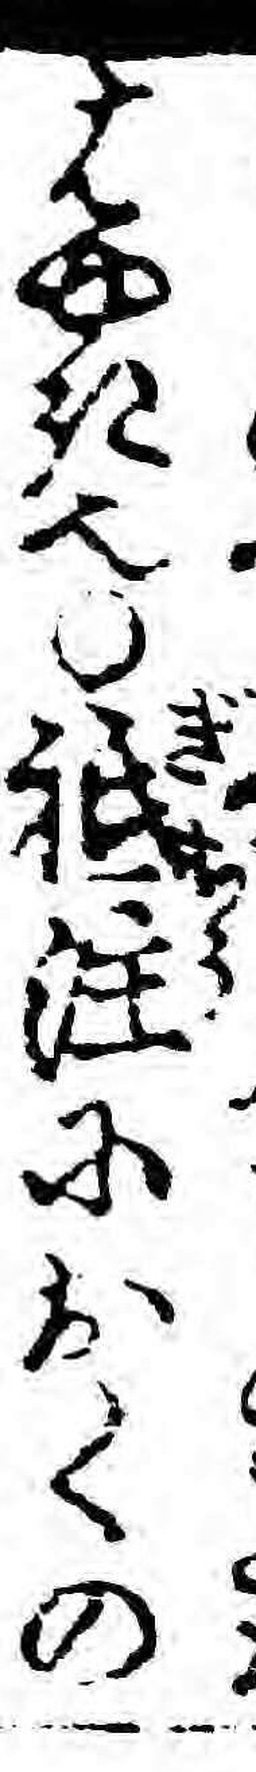はやき也〇祇注におくの
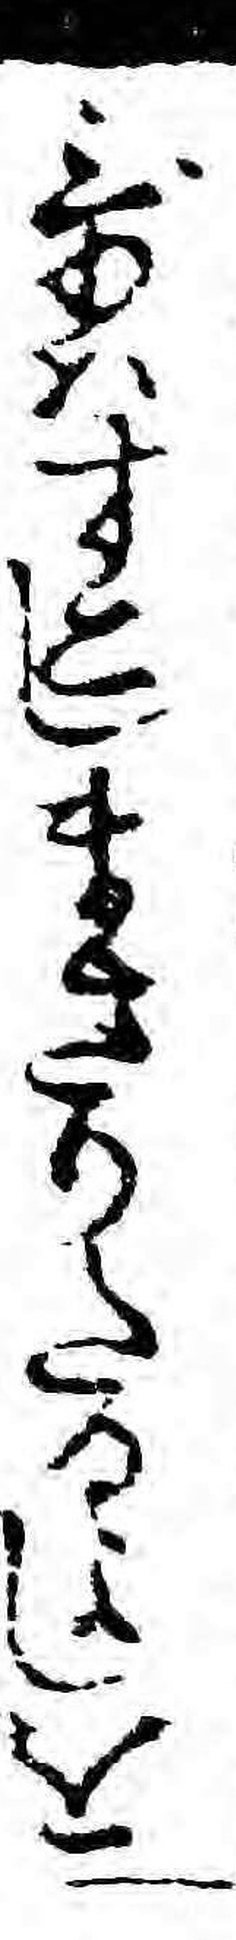哥はすこしまさりたるよしを
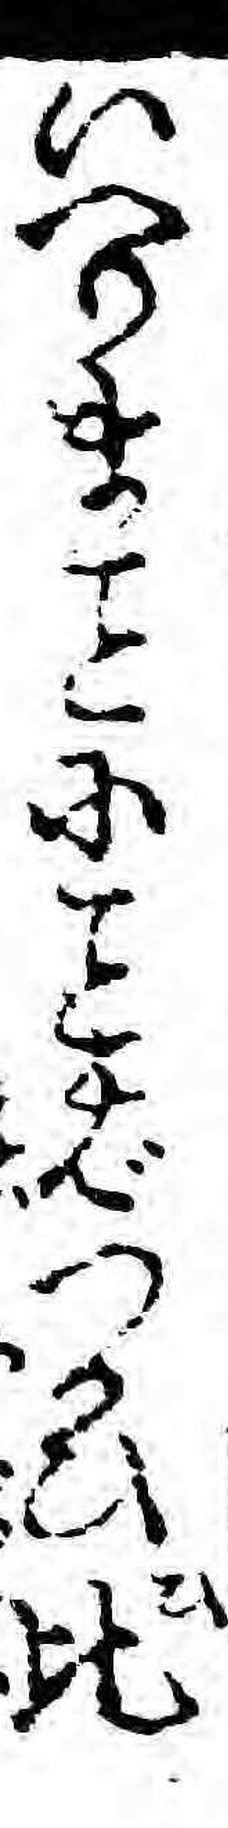いへりまことにことばつかひ比
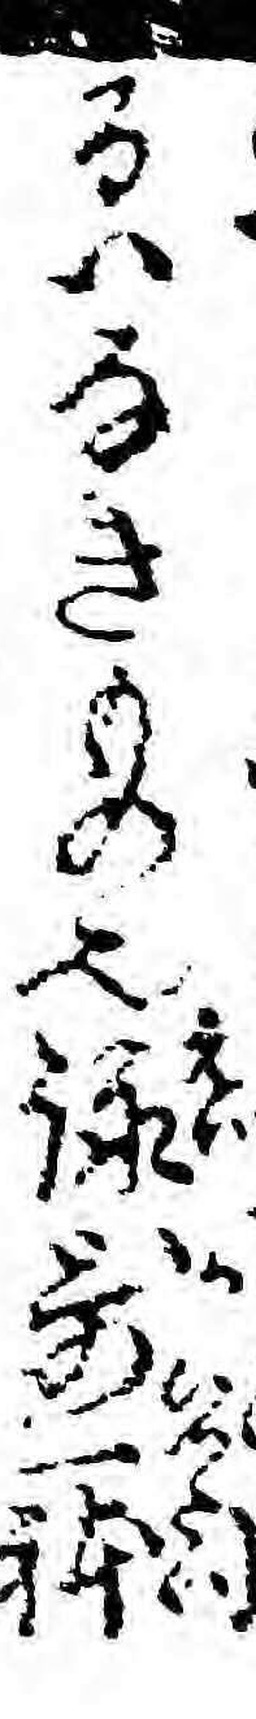るいなきもの也詠哥一體
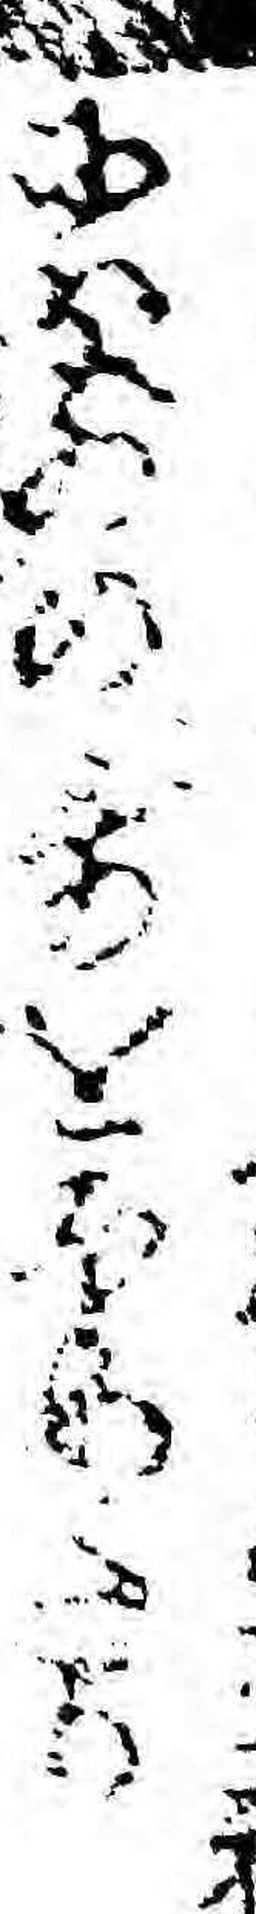には前の哥をほめたり
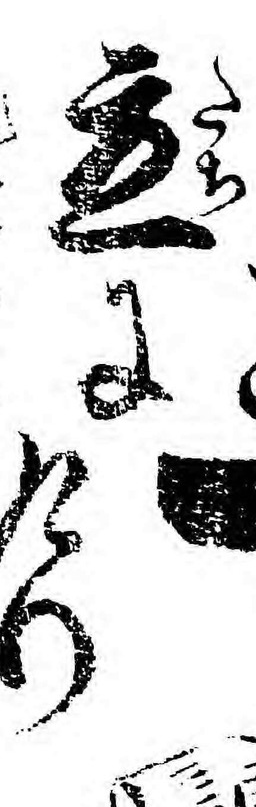立にけり
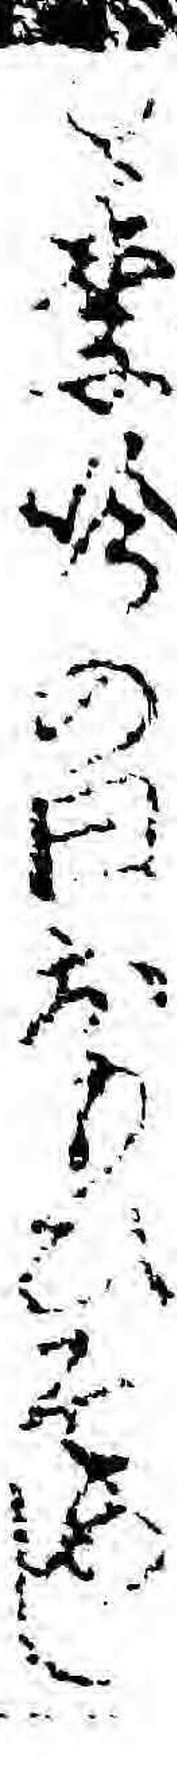〇季吟の曰おもひそめし
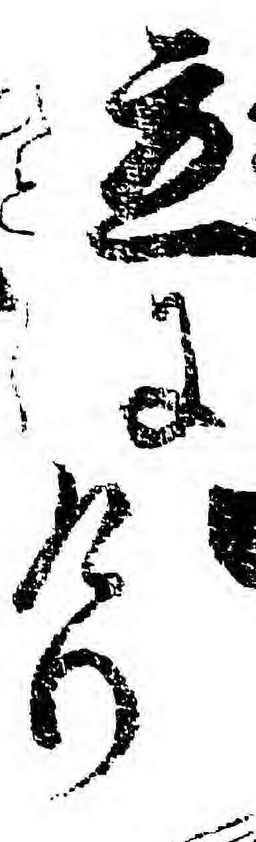立にけり
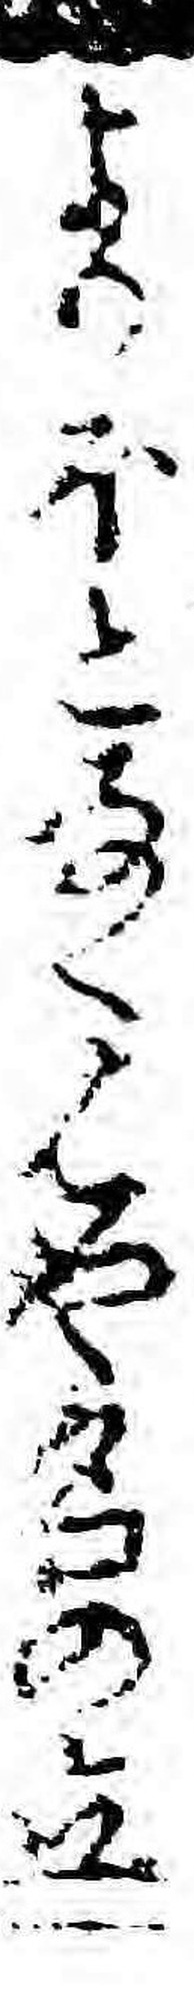よりほどなくはや名の立
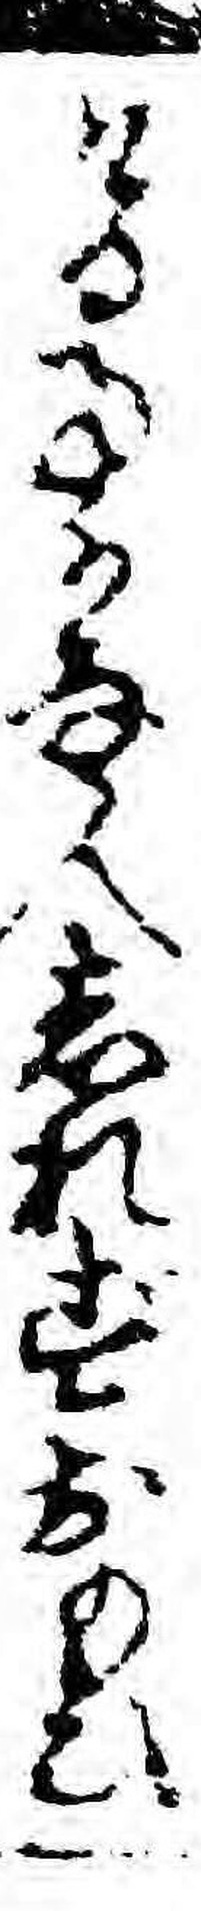ける事かな人しれずおもひ
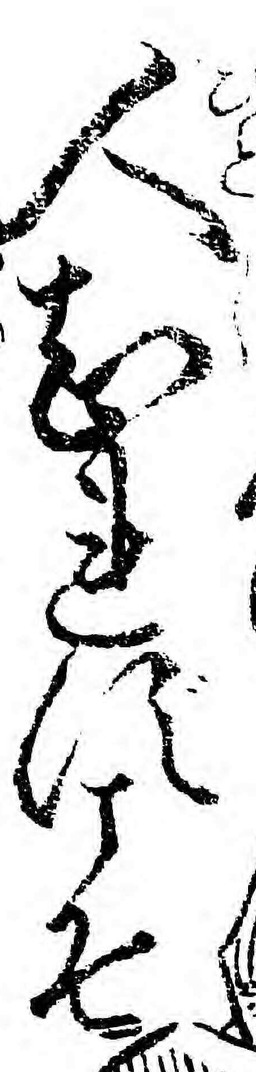人知れずこそ
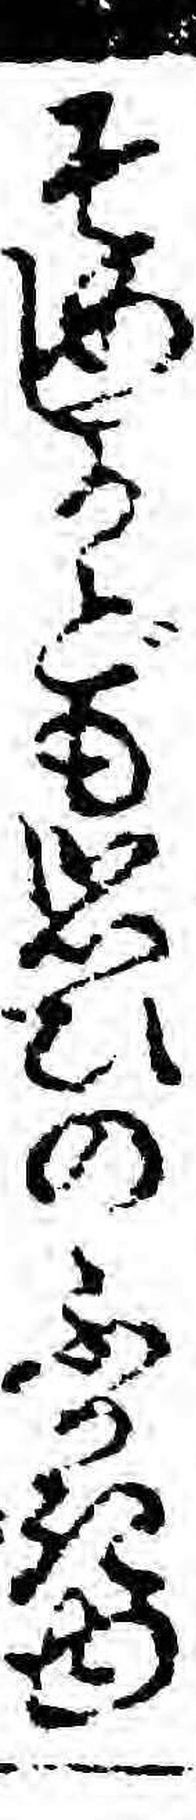そめしかども思ひのふかきゆ
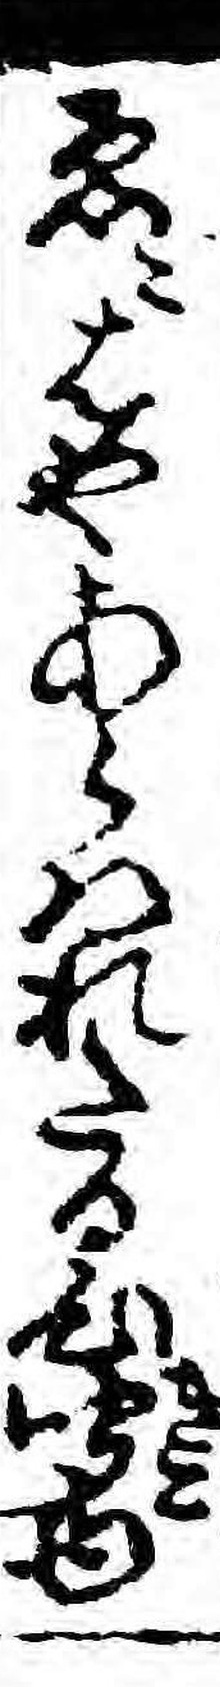ゑにはやあらはれたる心聞ゆ
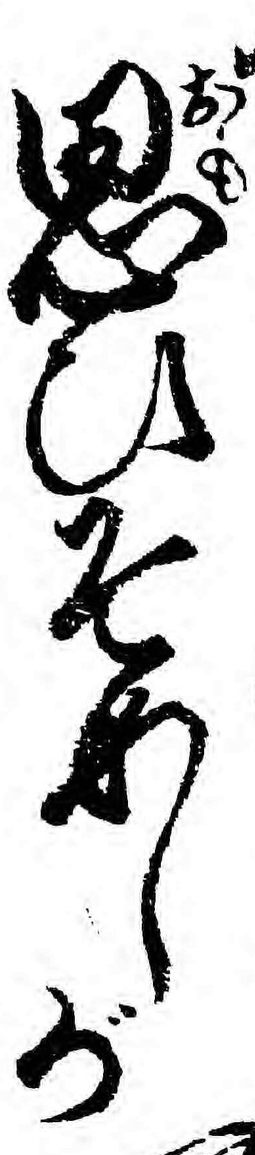思ひそめしが

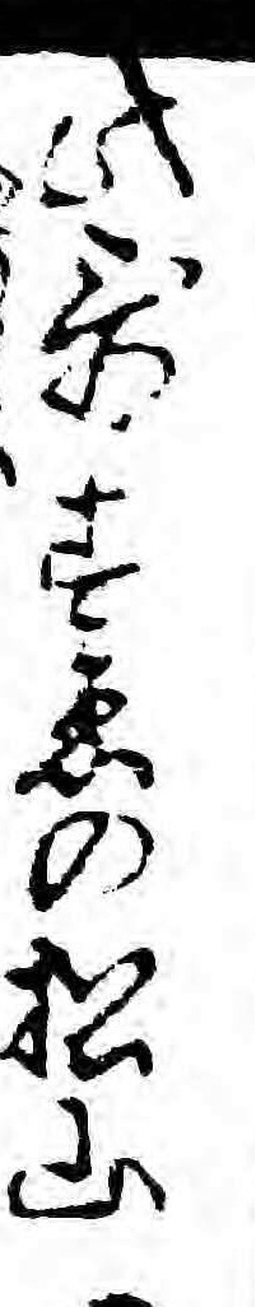此哥すゑの松山
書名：頭書和歌注譯／壽賀多百人一首小倉錦
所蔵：国文学研究資料館
